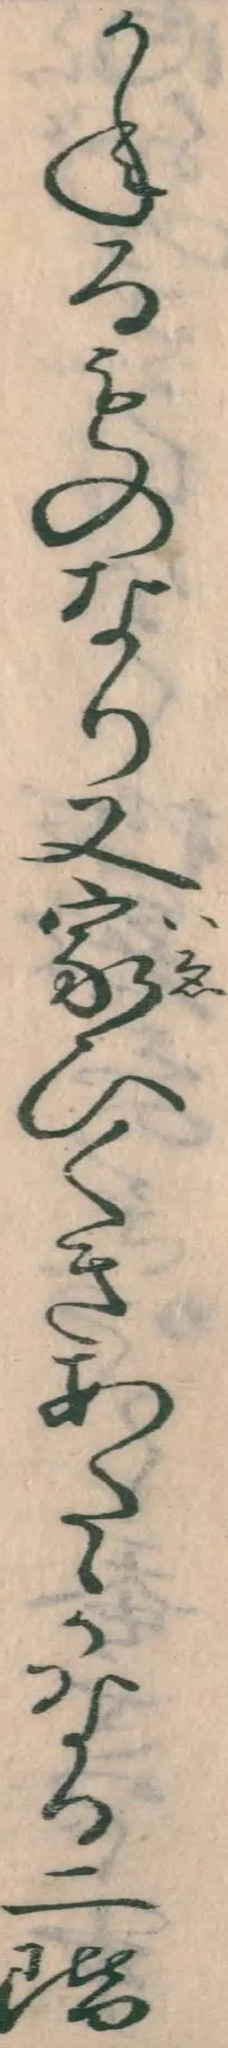かねるものなり又家ひくきあたゝかなる二階
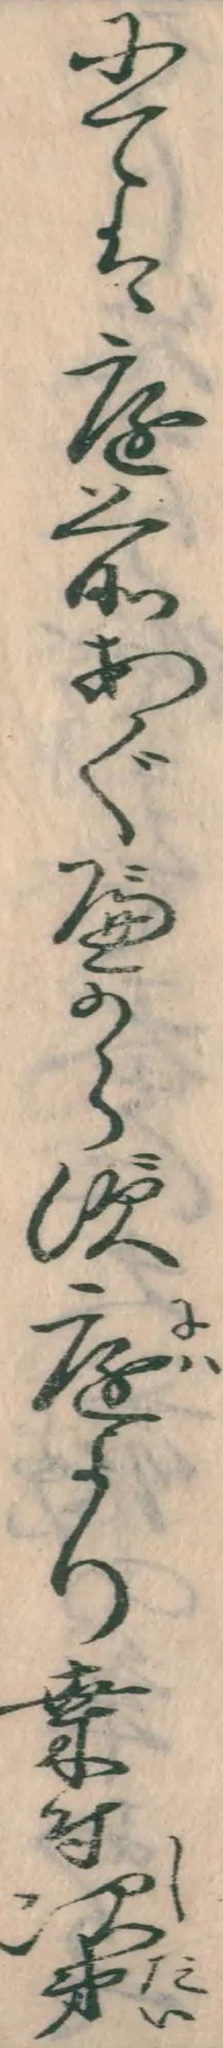にては庭前あぐべからず庭より桑付次第
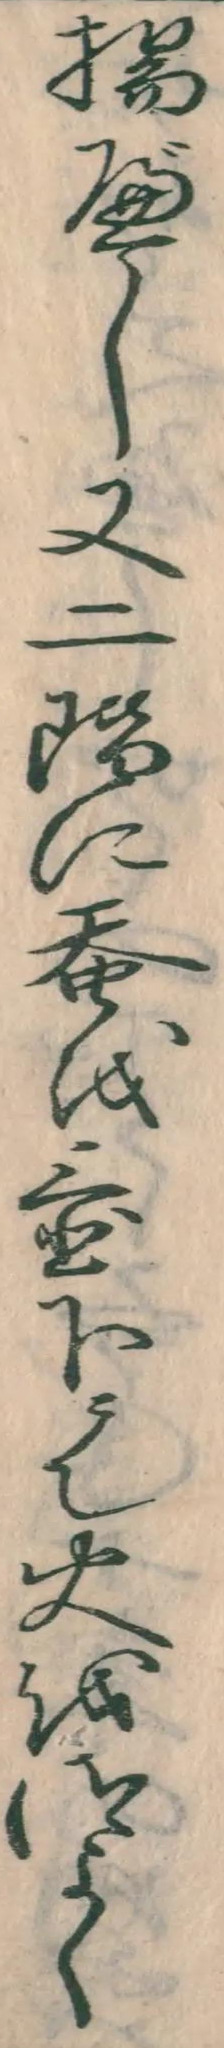揚べし又二階に蚕を置下にて火をつよく
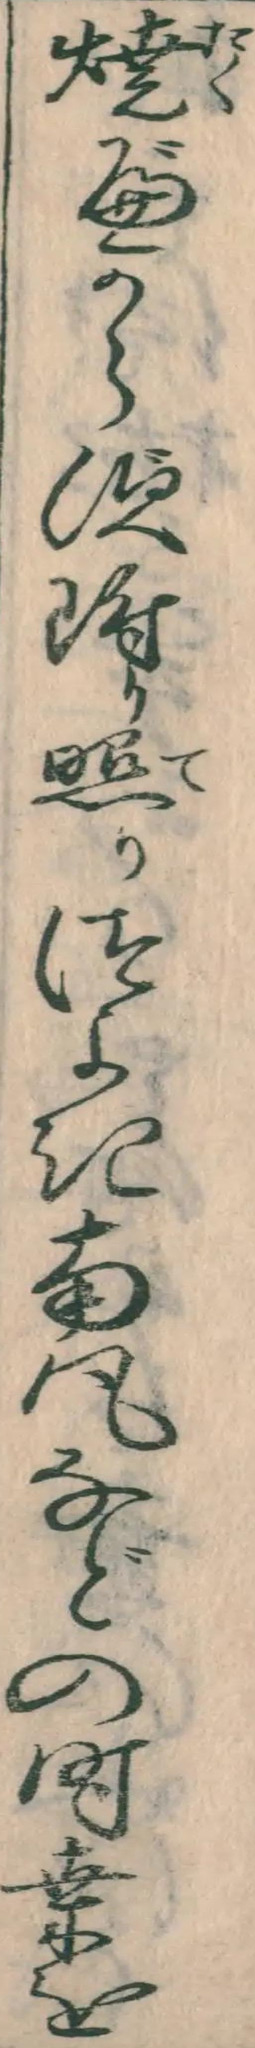焼べからず附り照りつよき南風などの時桑を

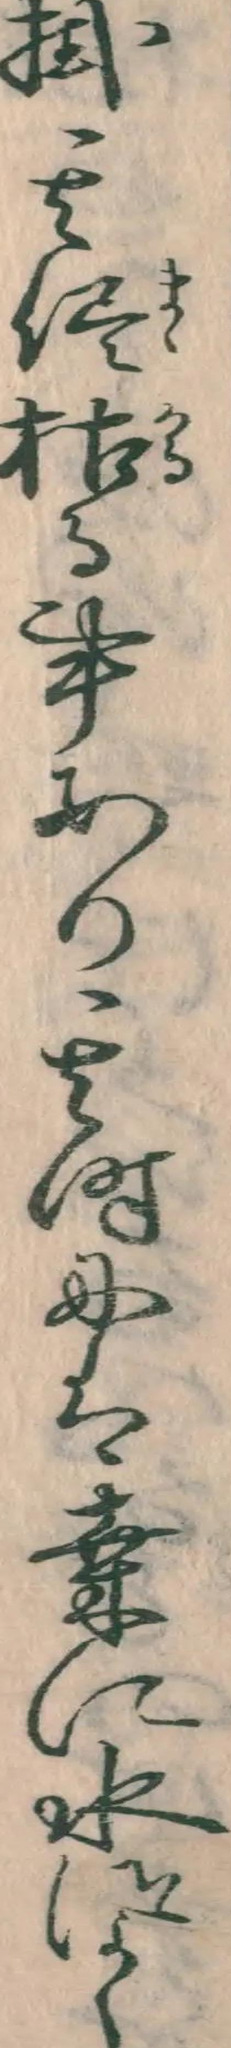掛其侭枯る事あり其時には桑に水つよく
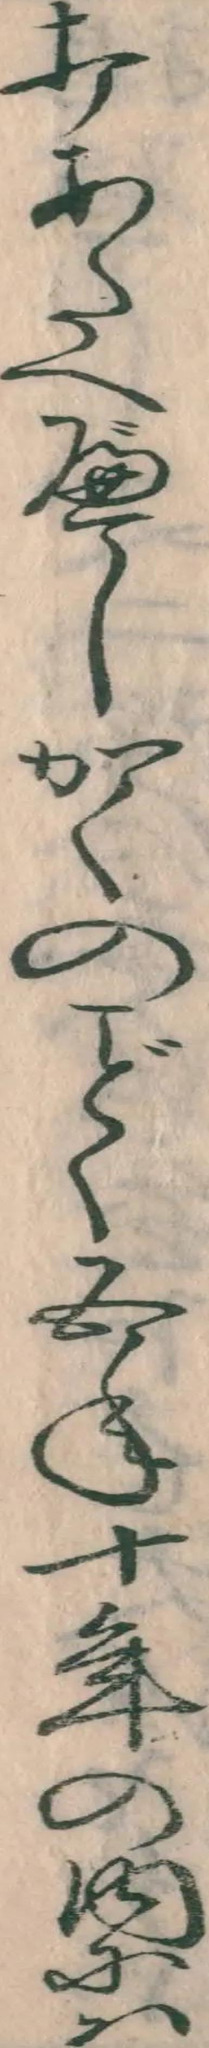打あたへべしかくのごとく五年十年の内には
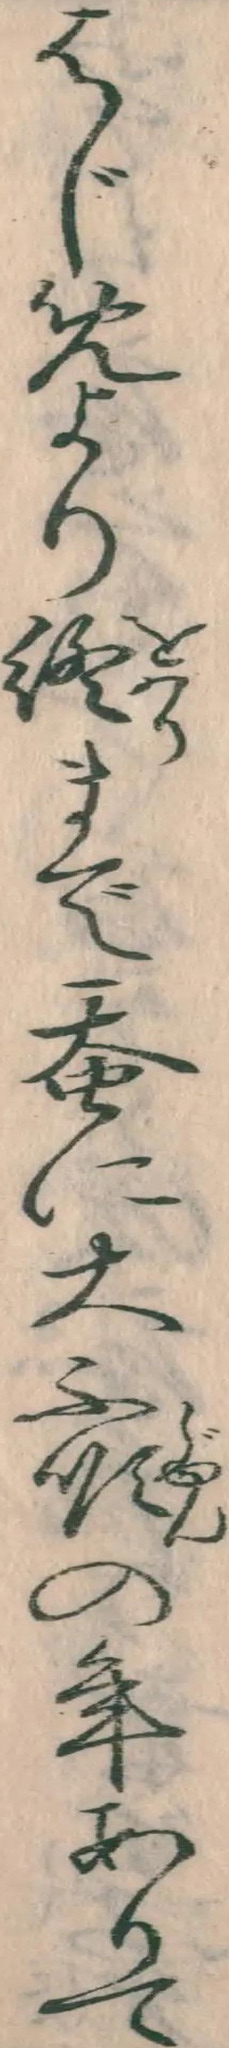はじめより終まで蚕に大不順の年ありて
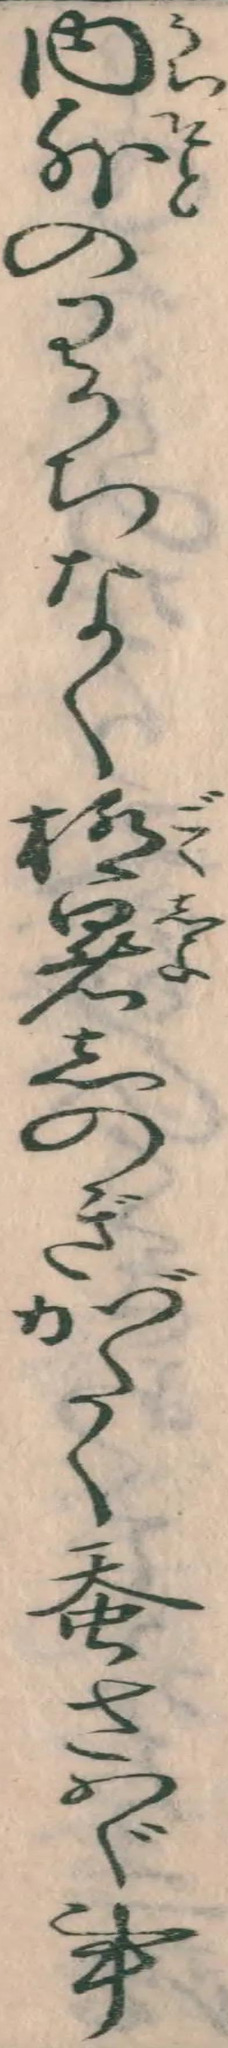内外のわかちなく極暑しのぎがたく蚕さはぐ事
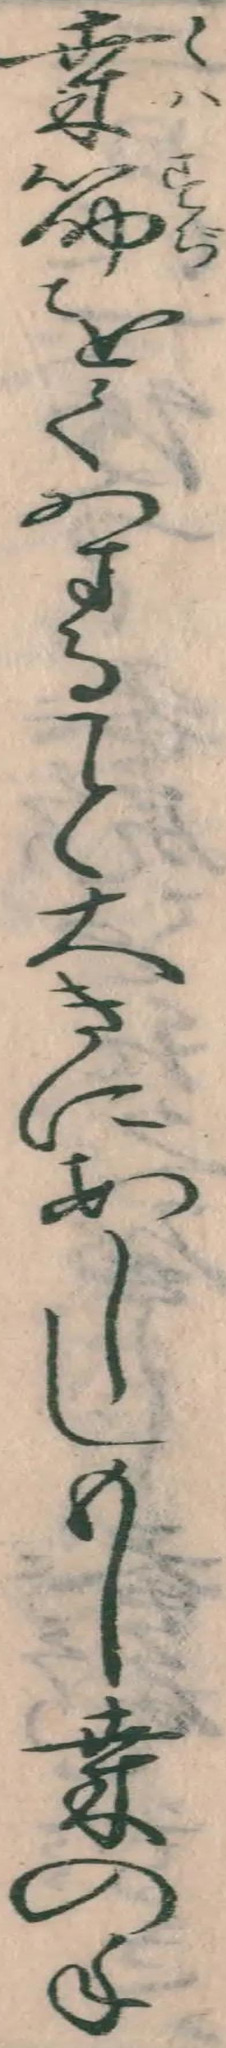桑筋をくはすること大きにあししもし桑の手
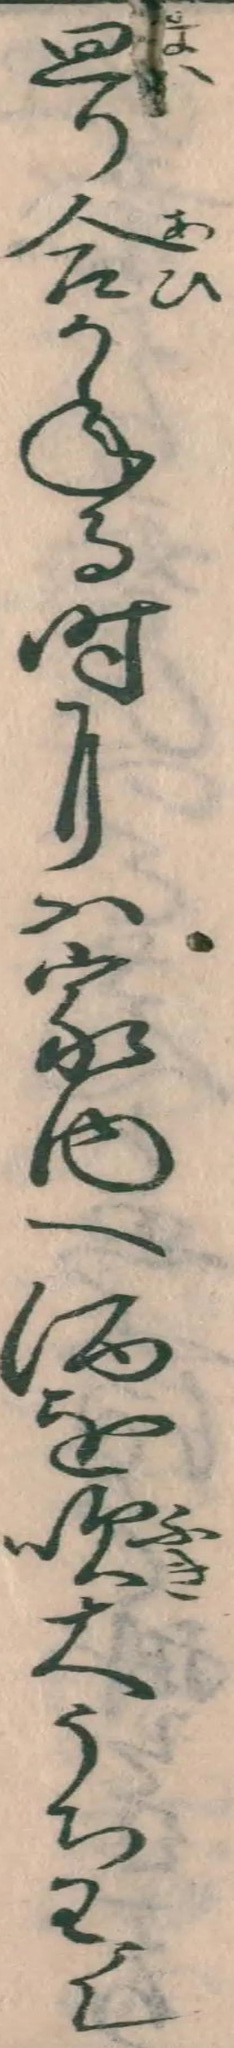廻り合かねる時には家内へ酒を吹大うちわにて
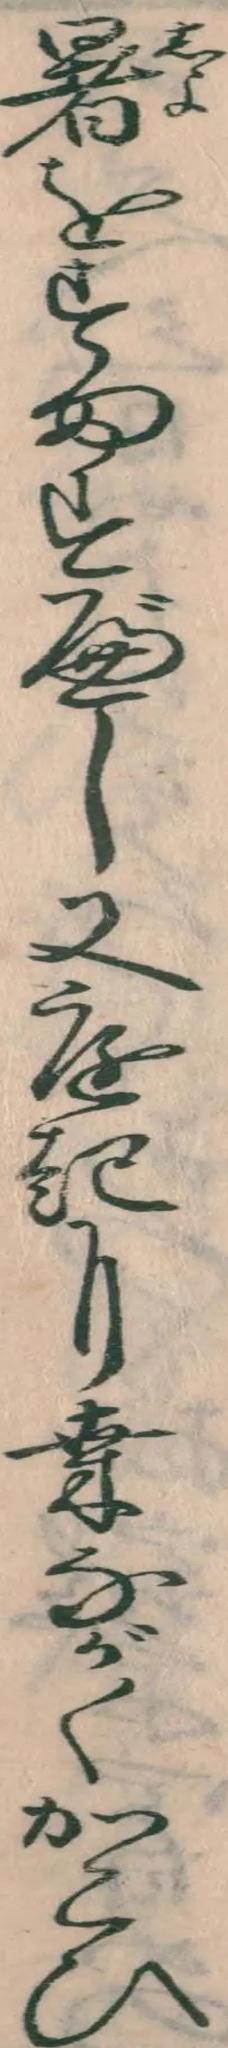暑をすますべし又庭起に桑ながくかこひ
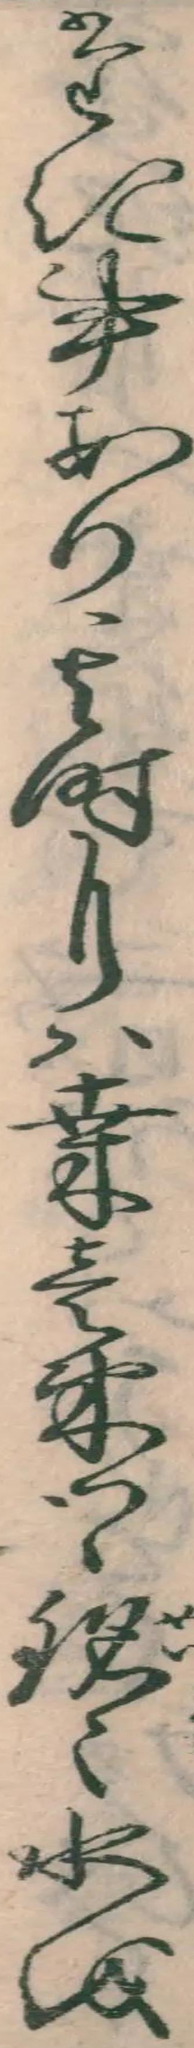たき事あり其時には桑壱束つゝ銘々水を
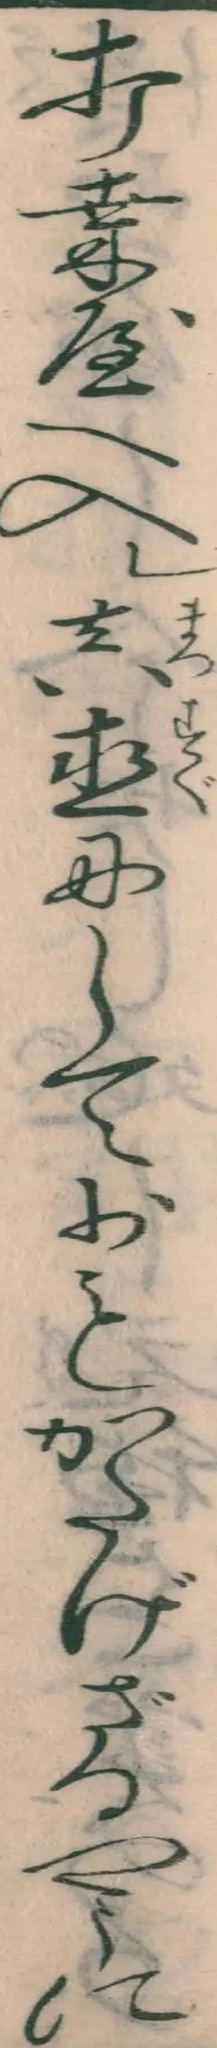打桑屋へ入れ真直にして少もかたげざるやうに
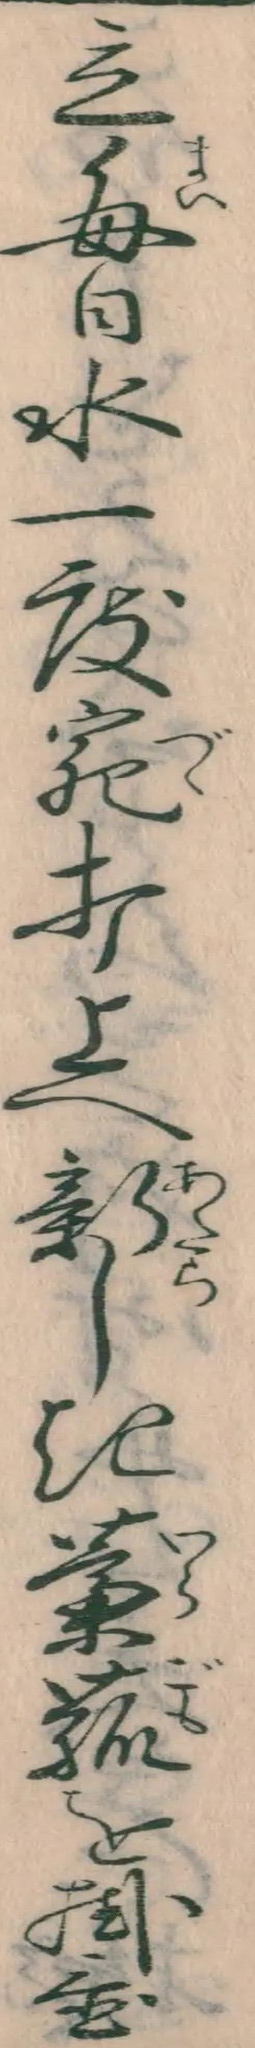立毎日水一度宛打上へ新しき藁菰を掛置
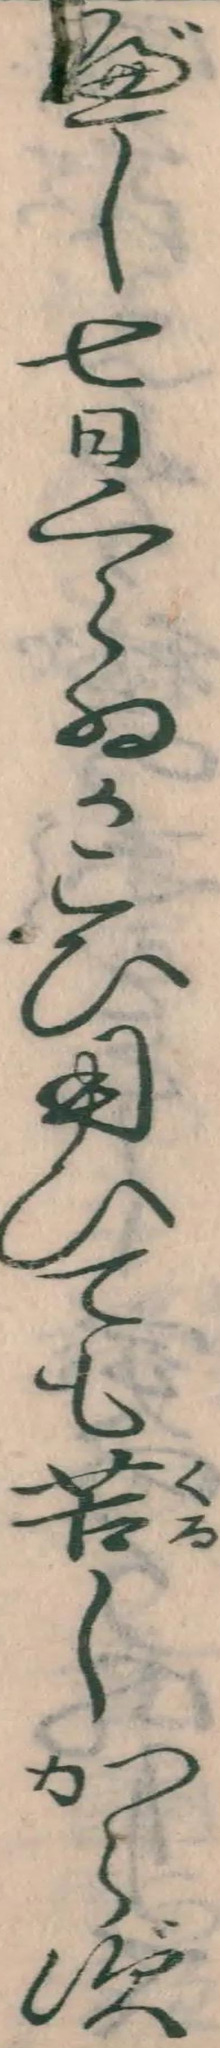べし七日くらゐかこひ用ひても苦しからず
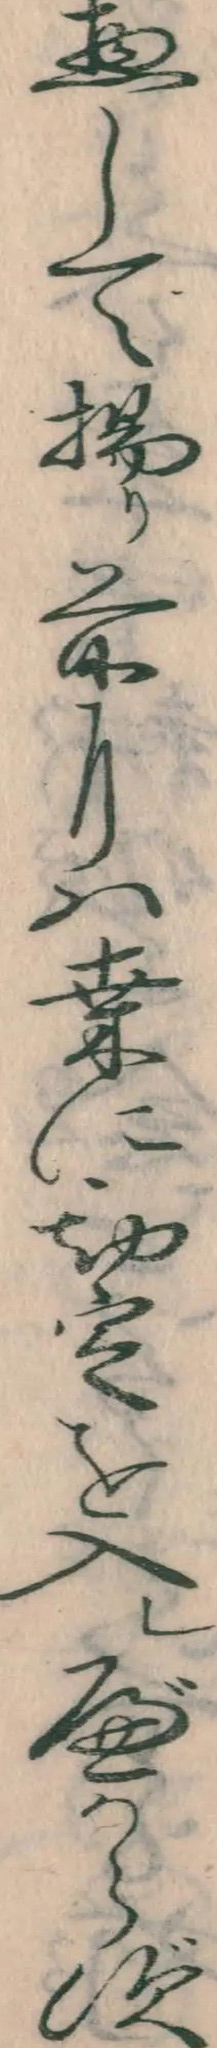惣して揚り前には桑に勘定を入れべからず
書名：新撰養蚕秘書
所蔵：国立国会図書館 National Diet Library, JAPAN
